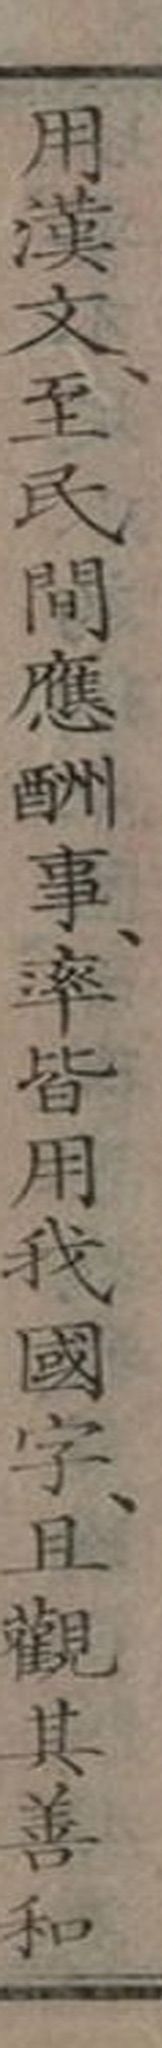用漢文、至民間応酬事、率皆用我国字、且観其善和
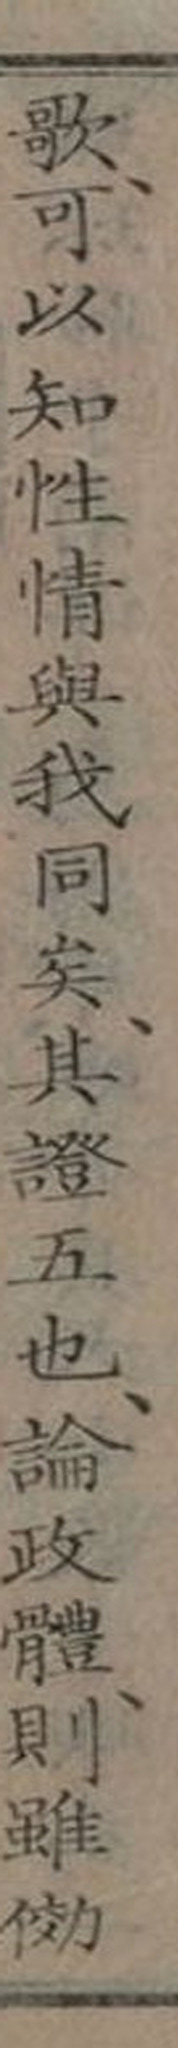歌、可以知性情与我同矣、其証五也、論政体、則雖俲
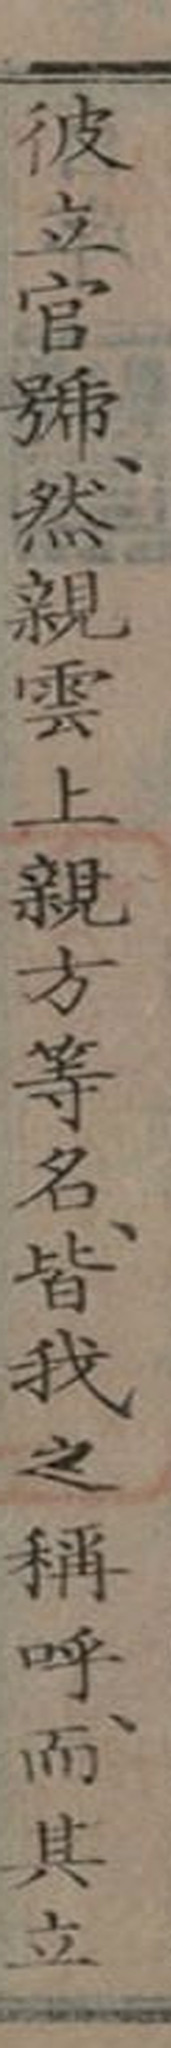彼立官号、然親雲上親方等名、皆我之称呼、而其立
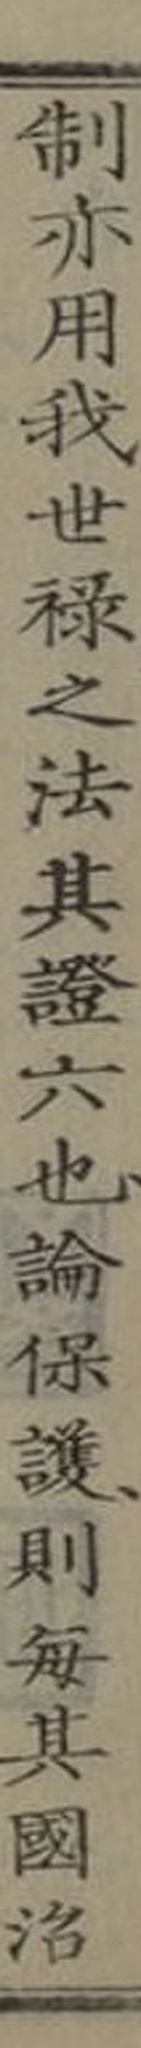制亦用我世禄之法其証六也、論保護、則毎其国治
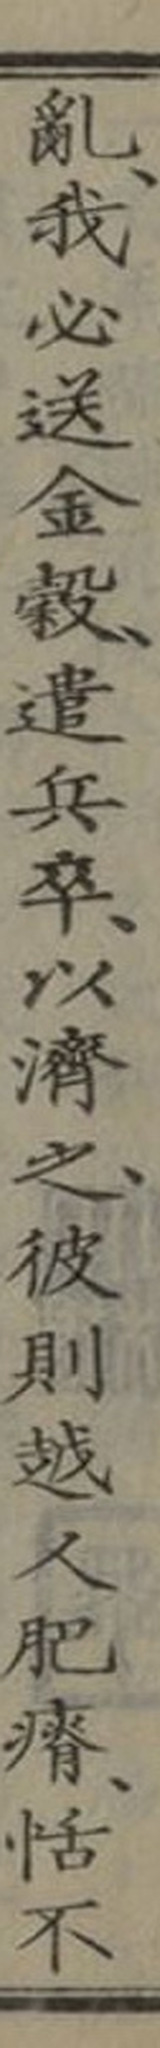乱、我必送金穀、遣兵卒、以済之、彼則越人肥瘠、恬不
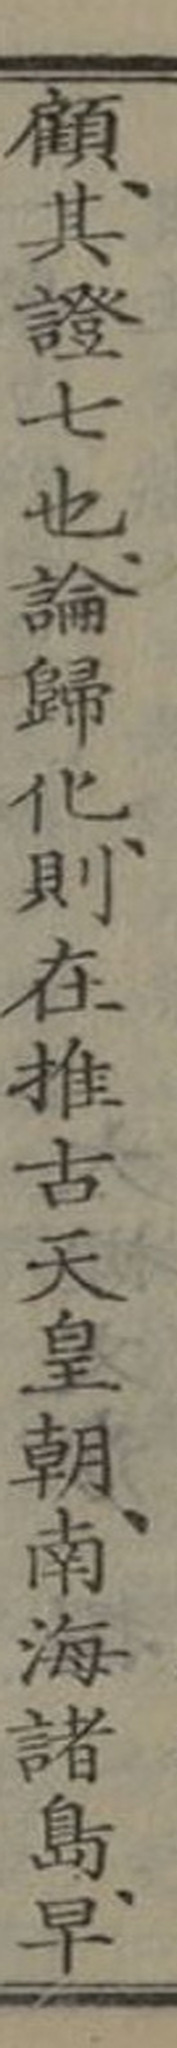顧、其証七也、論帰化、則在推古天皇朝、南海諸島、早
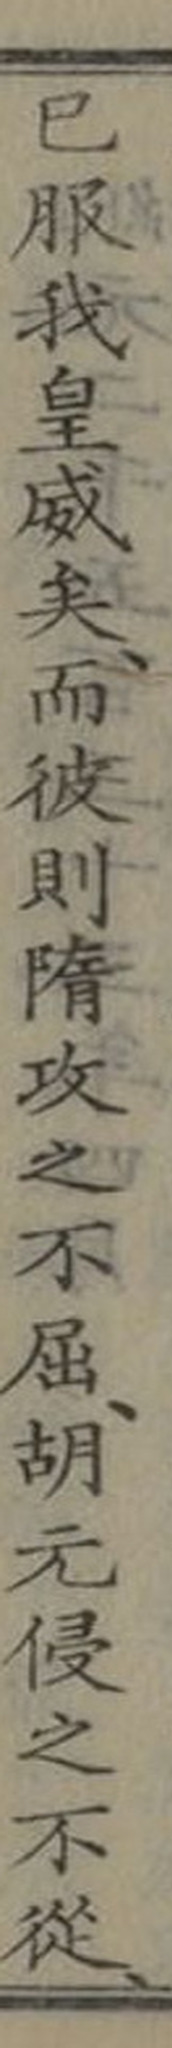巳服我皇威矣、而彼則隋攻之不屈、胡元侵之不従、
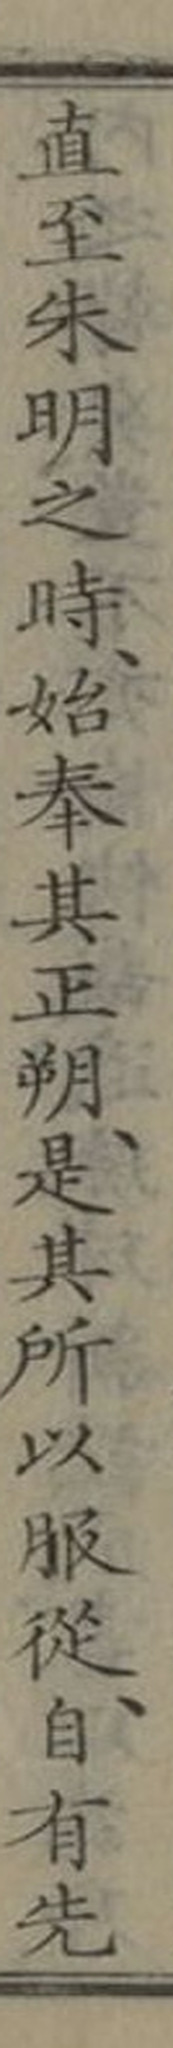直至朱明之時、始奉其正朔、是其所以服従、自有先
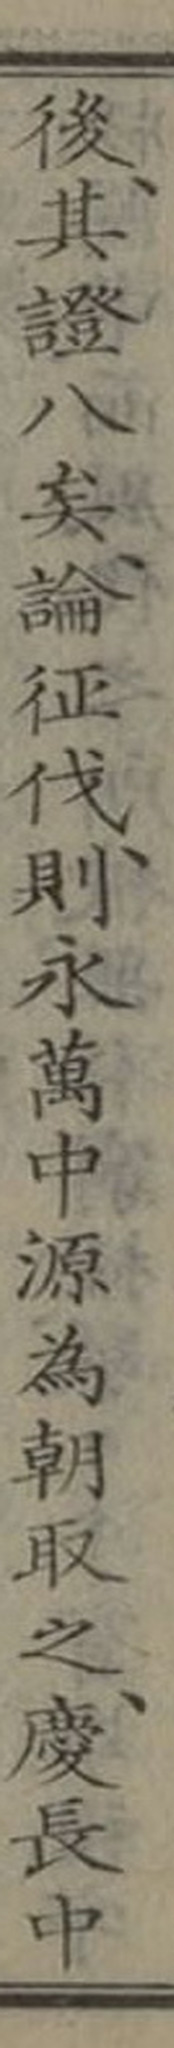後、其証八矣、論征伐、則永万中源為朝取之、慶長中
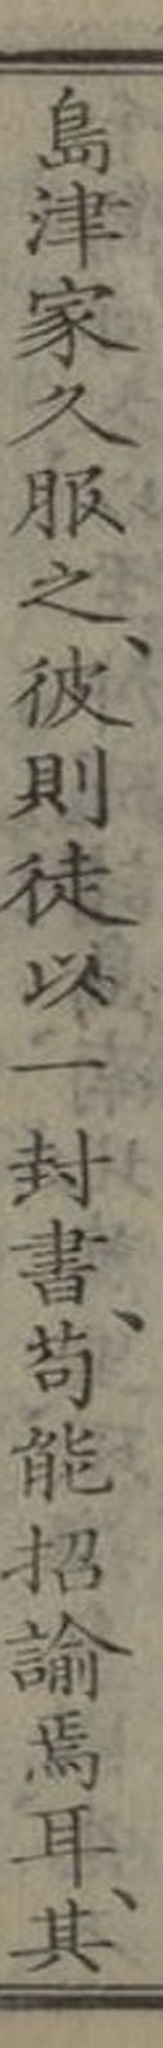島津家久服之、彼則徒以一封書、苟能招諭焉耳、其
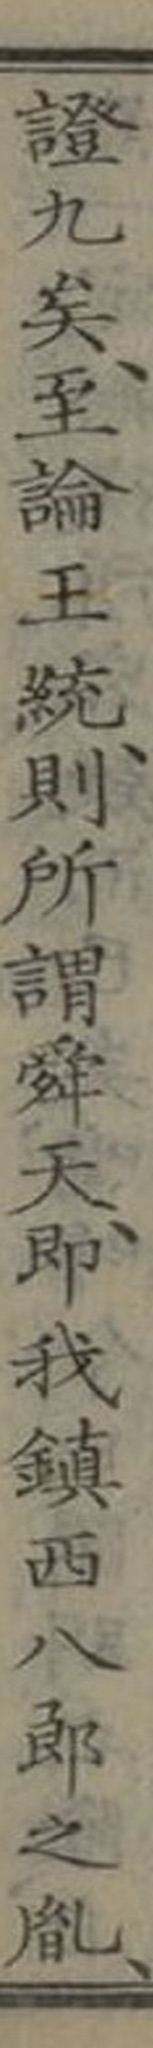証九矣、至論王統、則所謂舜天、即我鎮西八郎之胤、
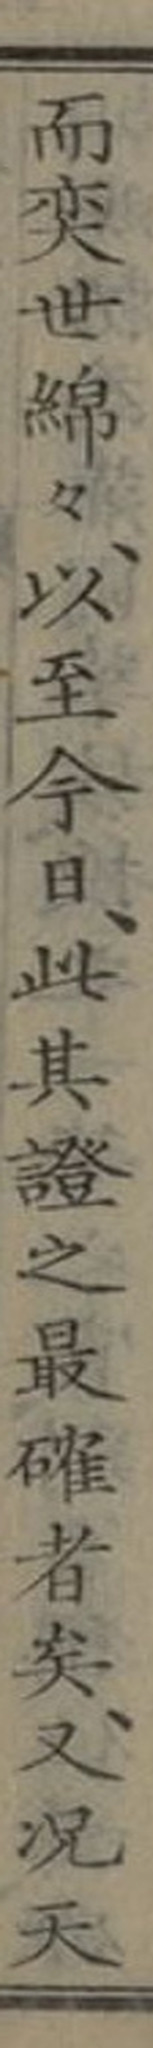而奕世綿々、以至今日、此其証之最確者矣、又況天

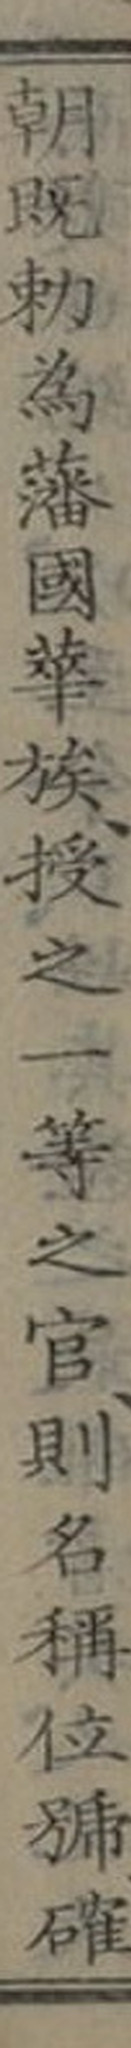朝既勅為藩国華族、授之一等之官、則名称位号、確
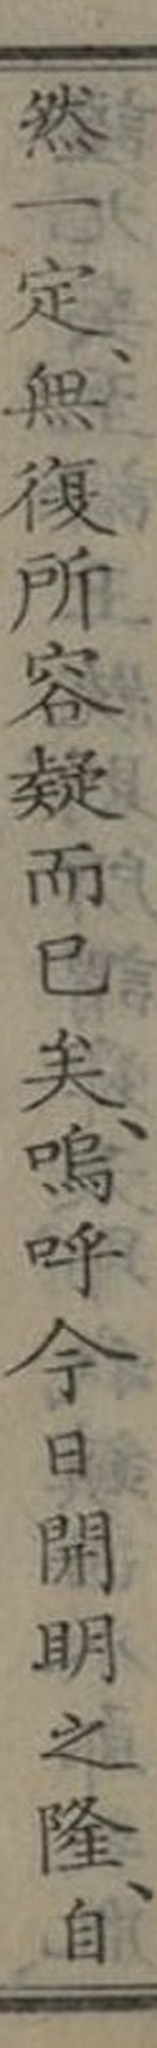然一定、無復所容疑而已矣、嗚呼今日開明之隆、自
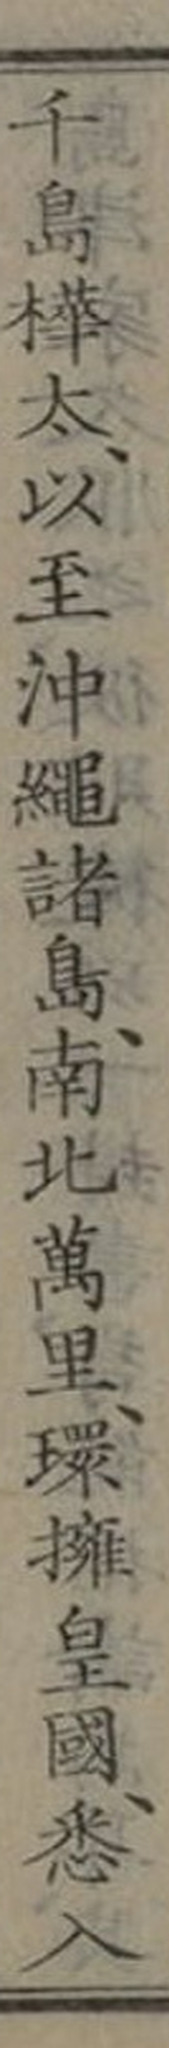千島樺太、以至沖縄諸島、南北万里、環擁皇国、悉入
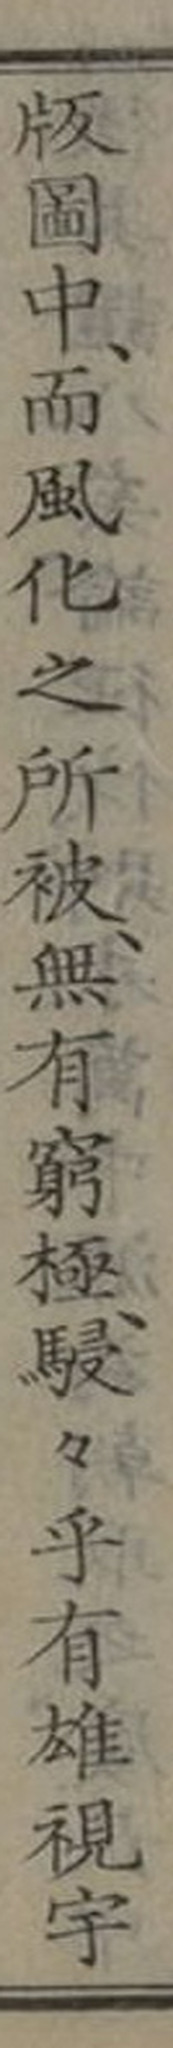版図中、而風化之所被、無有窮極、駸々乎有雄視宇
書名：琉球新誌 図附 上
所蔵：University of the Ryukyus Library
